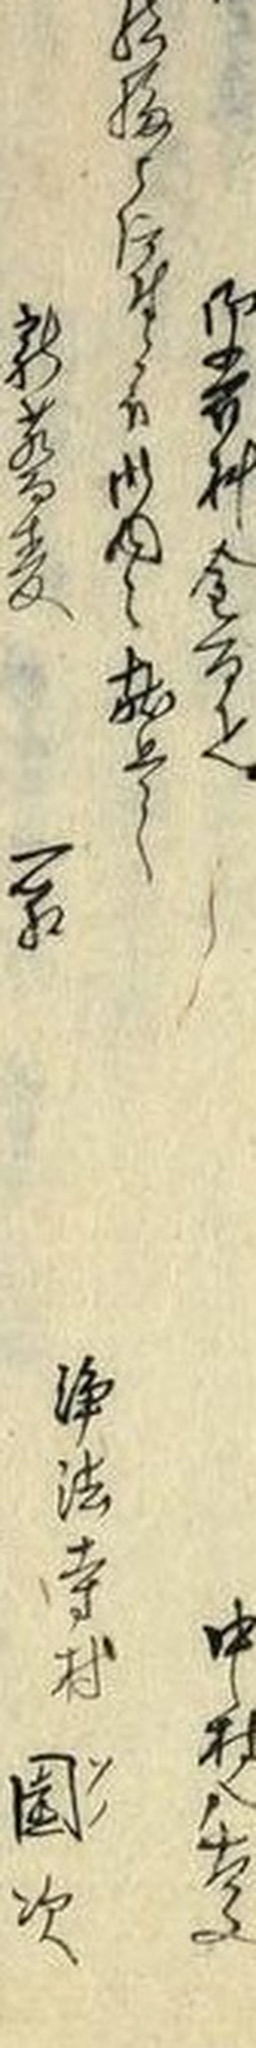新蕎麦一箱浄法寺村園次
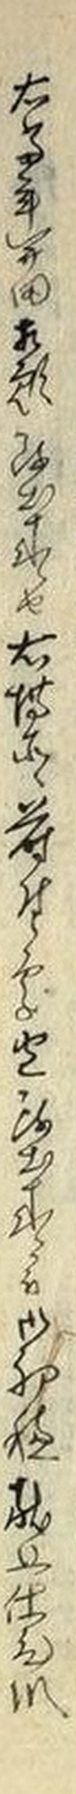右当年開田相願致出来候由右場所へ蒔付候処宜致出来候ニ付御初穂献上仕度段
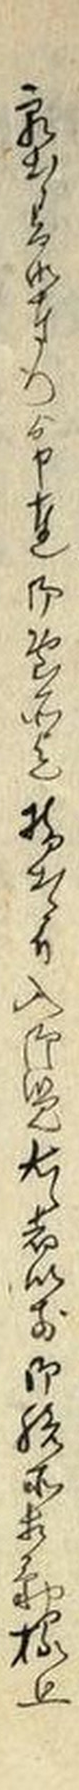願出候旨御奉行ゟ申達御台所迄指出候ニ付入御覧右之者以前御膳所相勤縁上
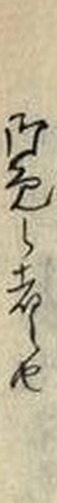御免之者之由
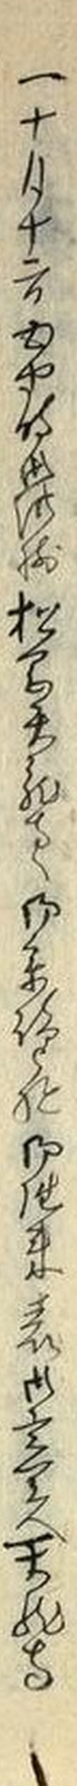一十月十二日五半時御供揃松岡天龍寺へ御参詣被遊御往来表御玄関へ天竜寺
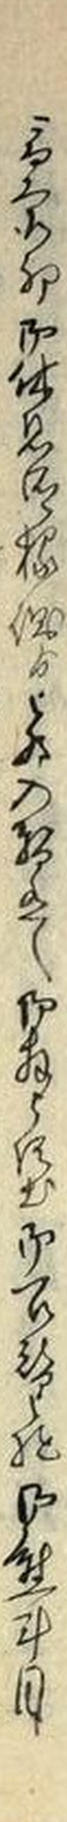ニ而最初御休息所へ椽側ゟ被為入暫有之御拝被仰出御召替被遊御熨斗目
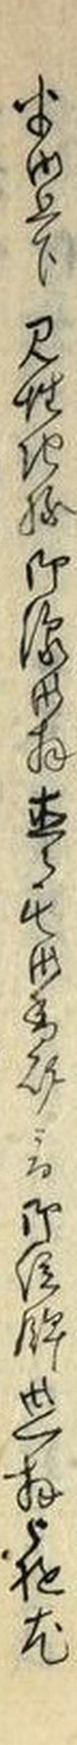半御上下見性院様御像御拝直ニ其御香炉ニ而御位牌御一拝被遊尤
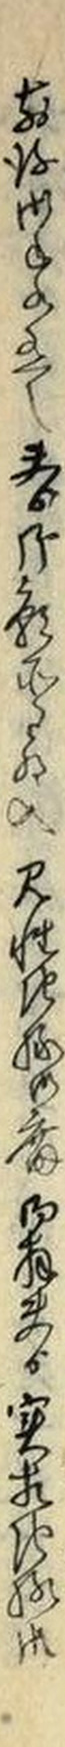前後御手のし有之夫ゟ御廟所へ被為入見性院様御廟御拝夫ゟ実相院様御
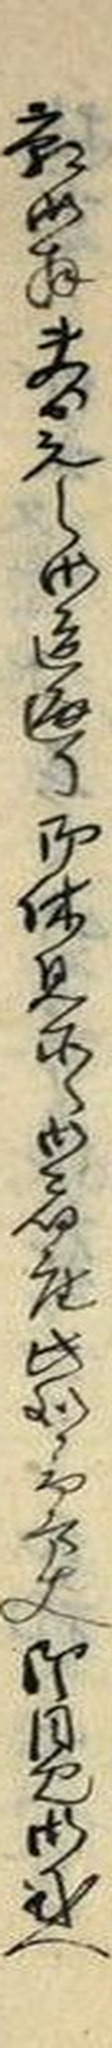廟御拝夫ゟ元之御道通り御休息所へ御着座此所ニ而方丈御目見御用人

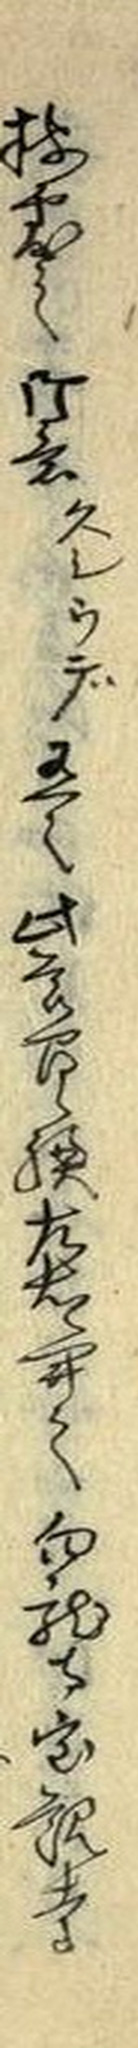披露之御意久シウデ有之此節間之襖左右へ開之白龍寺宝観寺
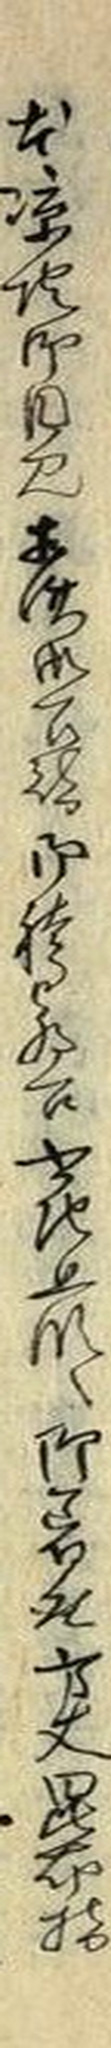本涼院御目見相済御召替御袴被為召書院上段へ御着座方丈昆布指
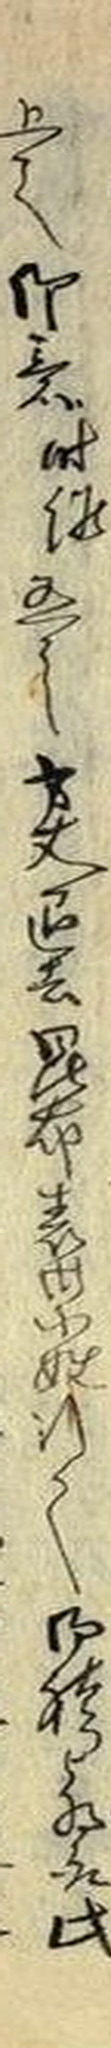上之御意時候有之方丈退去昆布表御小姓引之御袴被為取此
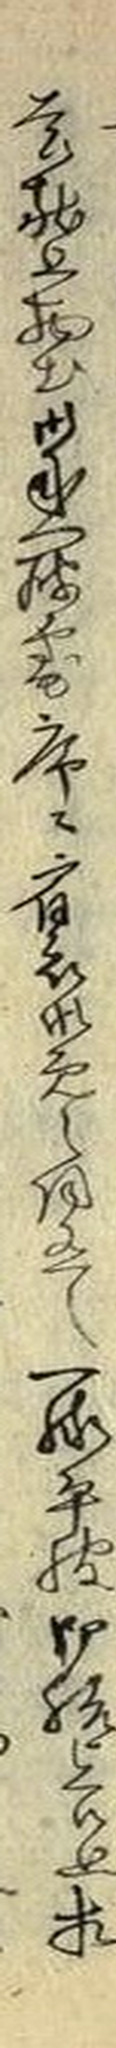節献上物出御用人披露序ニ肩衣御免之伺有之一統平服御膳被召上相
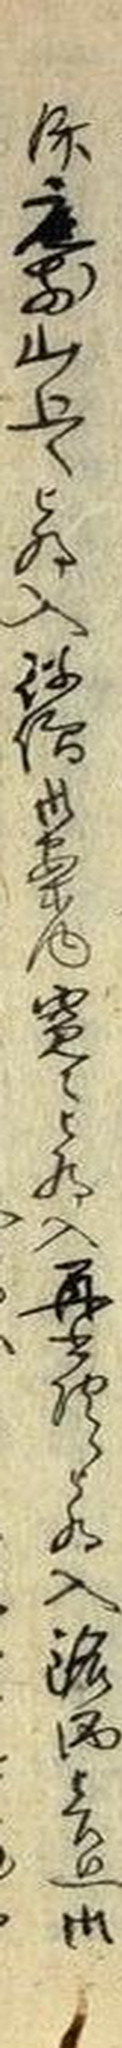済庭前山上へ被為入役僧御案内寛々被為入再書院へ被為入銘酒差上御
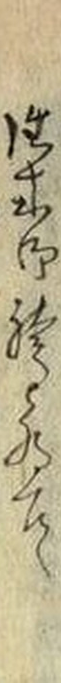往来御袴被為召候
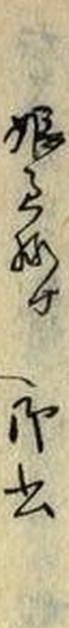姫君様ゟ御書
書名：少傅日録抄（斉承付側向頭取日記、在国）
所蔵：福井県文書館 Fukui Prefectural Archives
